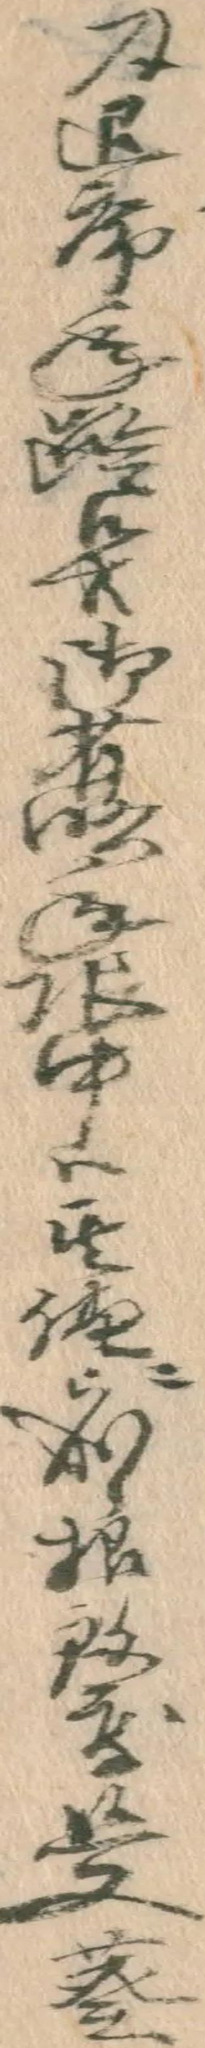及退席年齢候共御省略年限中ハ其侭ニ被成候様致度且又葵
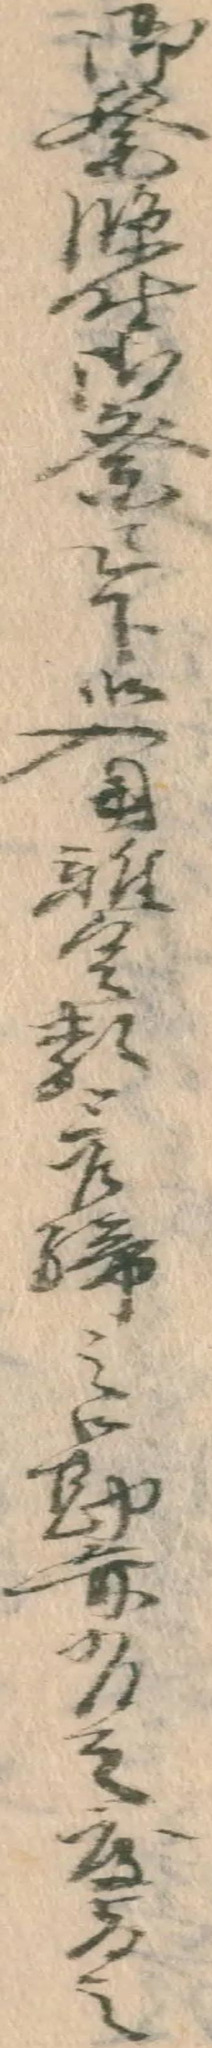御祭臨時御祭已下御入用雑具類御取締之御勘弁有之度旨之
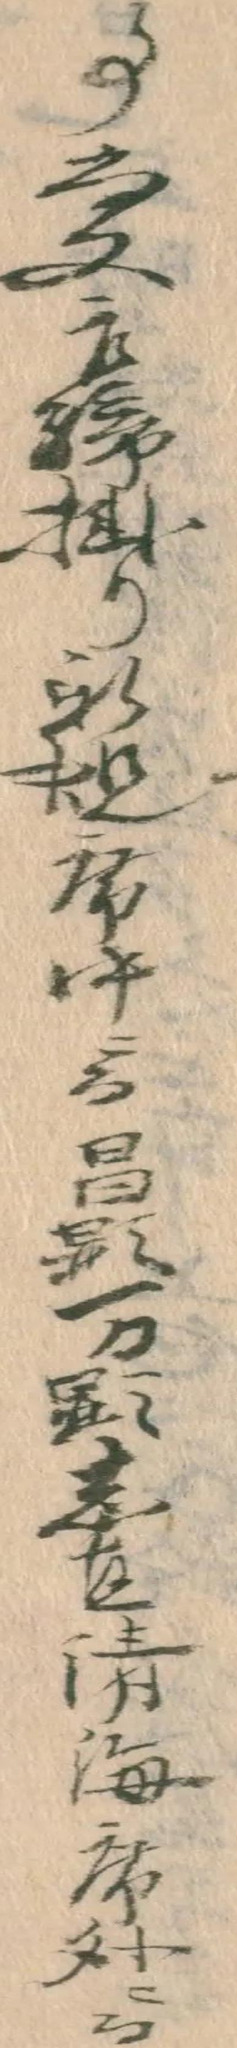事尚又取締掛り新規席中ニ而昌顕万顕志直清海席外に而
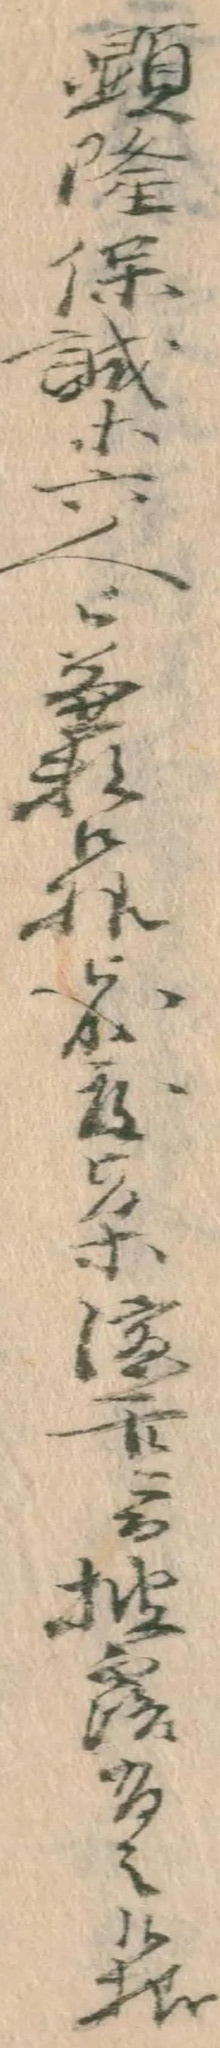頭隆保誠等六人被而兼頼候様被成度旨等演舌ニ而披露有之候様
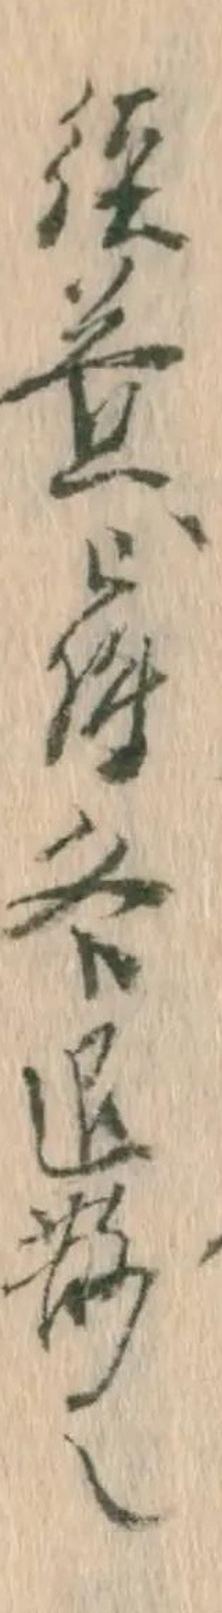経益被附各退散之
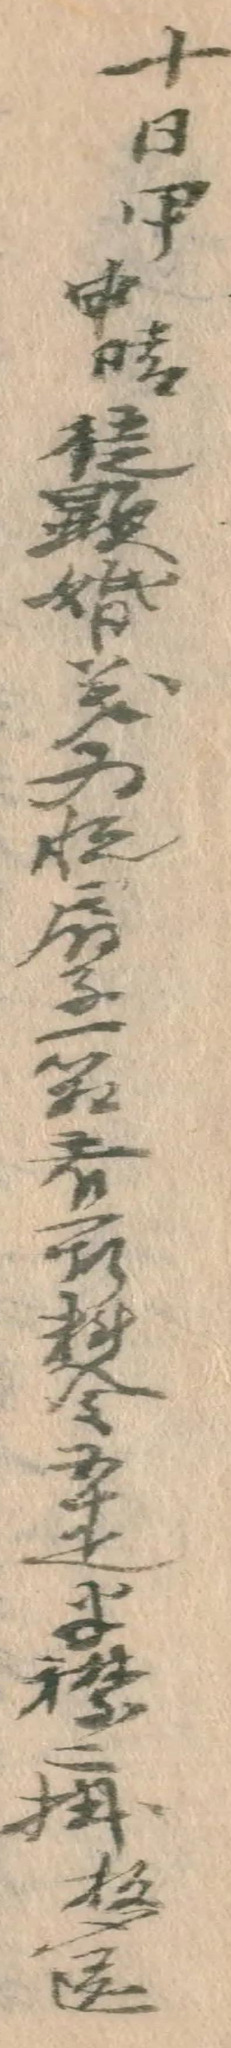十日甲申晴徒顕婚義為祝扇子一箱肴一折料金五十疋半襟二掛板〆送
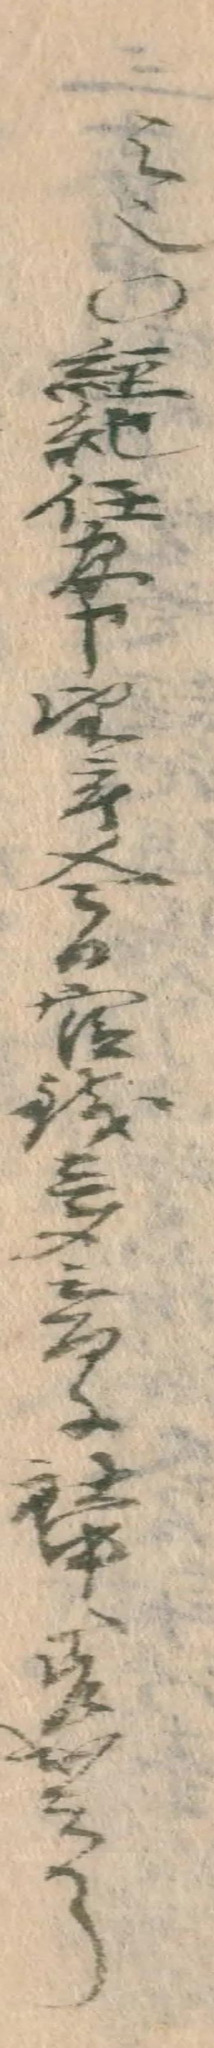之也○経紀任官申望ニ付今日官銭壱〆三百文仕中へ差出了
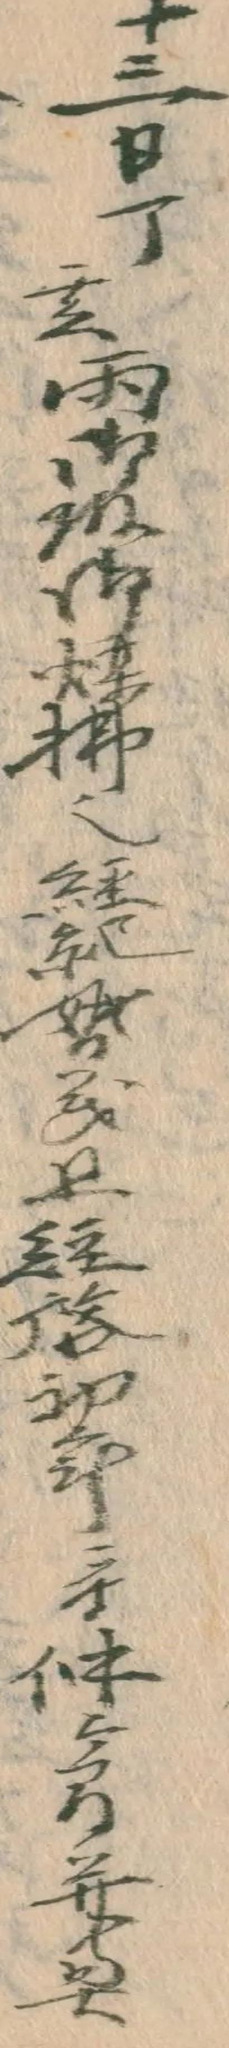十三日丁亥雨御殿御煤払也経紀婚義且経啓初ニ付仲ヶ間并奥
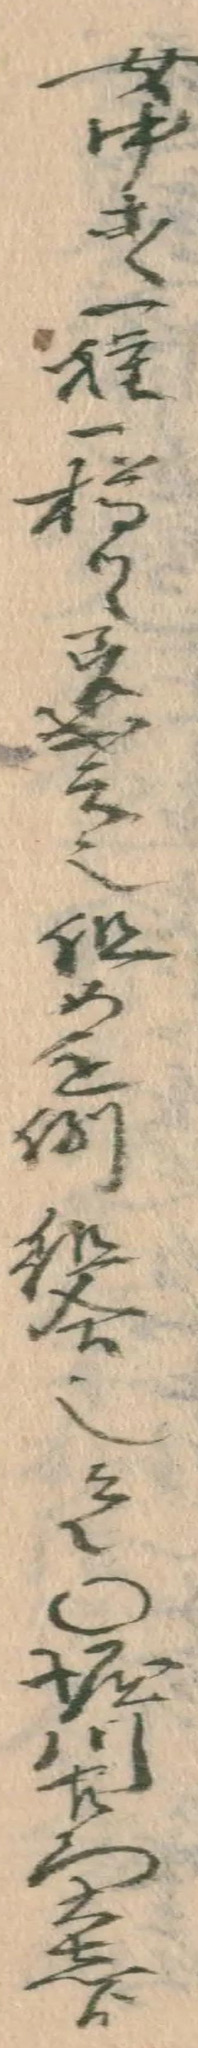女中等へ一種一樽ツヽ差出之也但如近例組合也云々○堀川左衛門大志ゟ
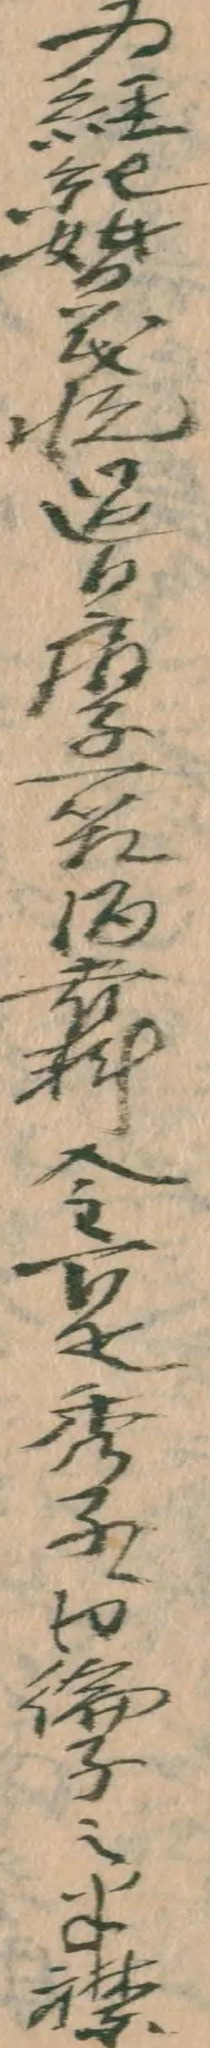為経紀婚義祝過日扇子一箱酒肴料金百疋秀子へ白倫子之半襟
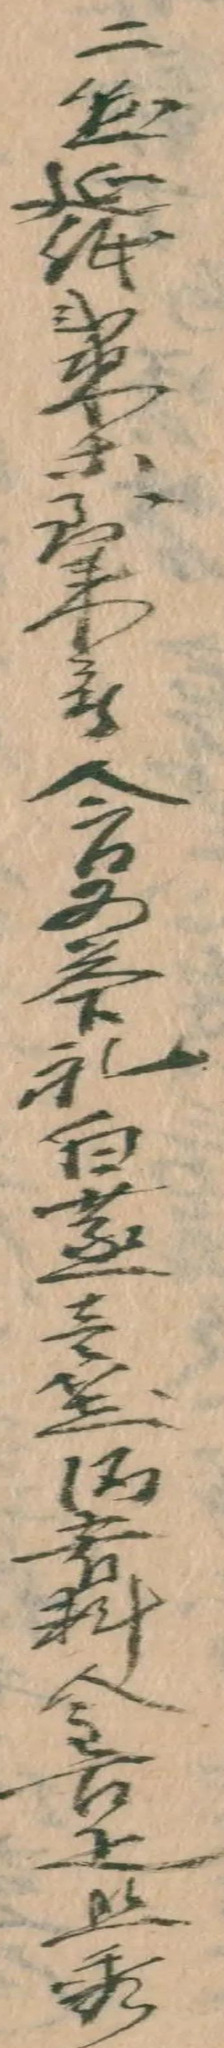二懸延紙弐束等到来二付今日為答礼白蒸壱器酒肴料金百疋且秀
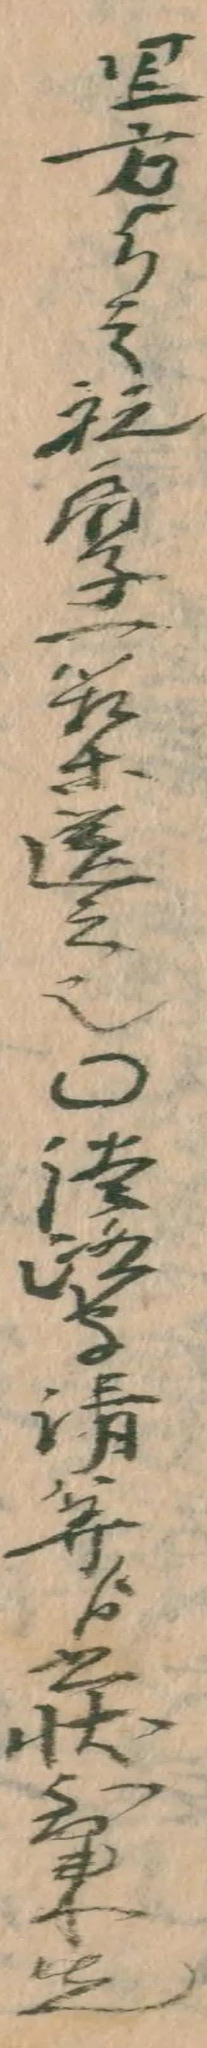里方より之祝扇子一箱等送之也〇淡路守清算ゟ書状到来先
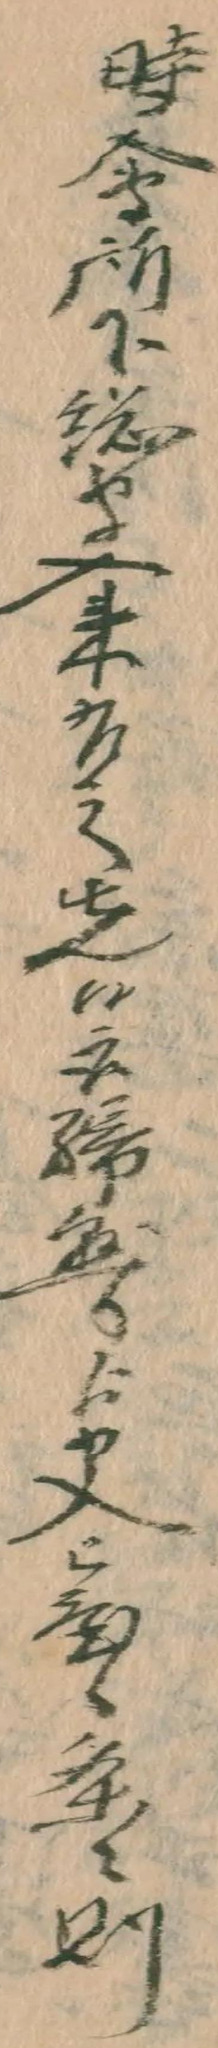時會所下総守入来有之先日取締懸りゟ申入被置候条々則
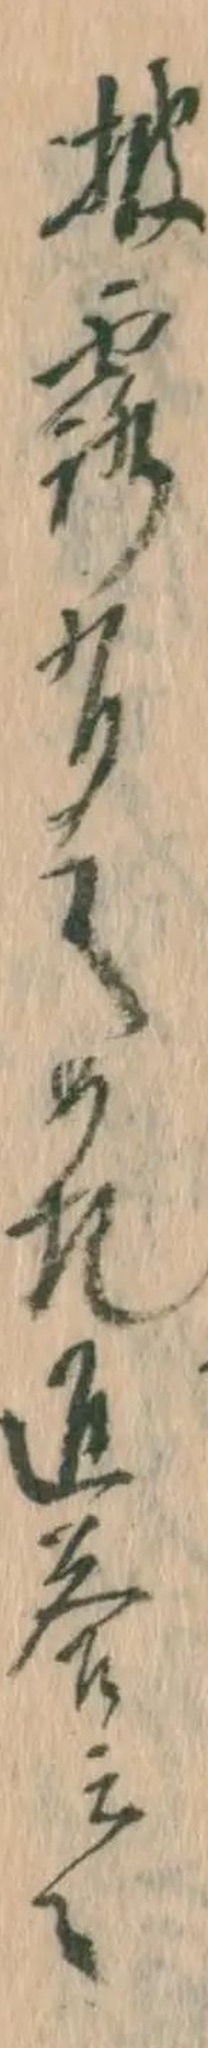披露有之如左左返答云々
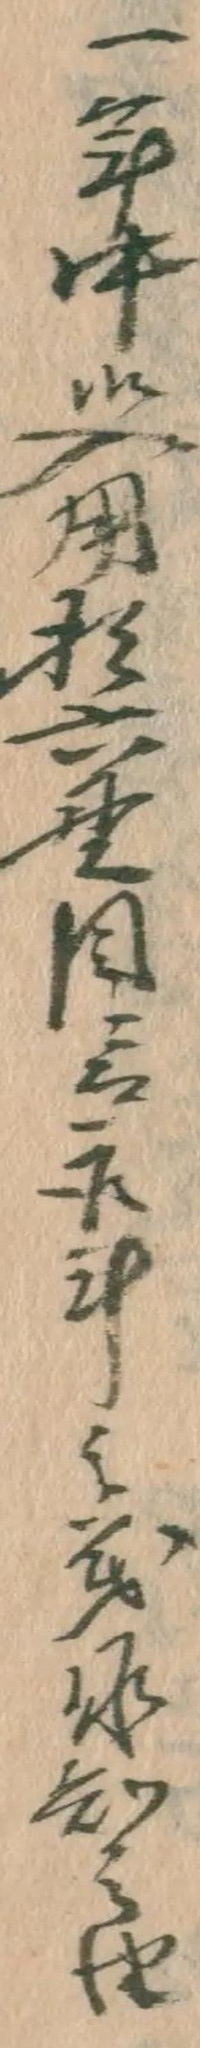一年中御入用拾六貫目ニ而取斗之義承知之由
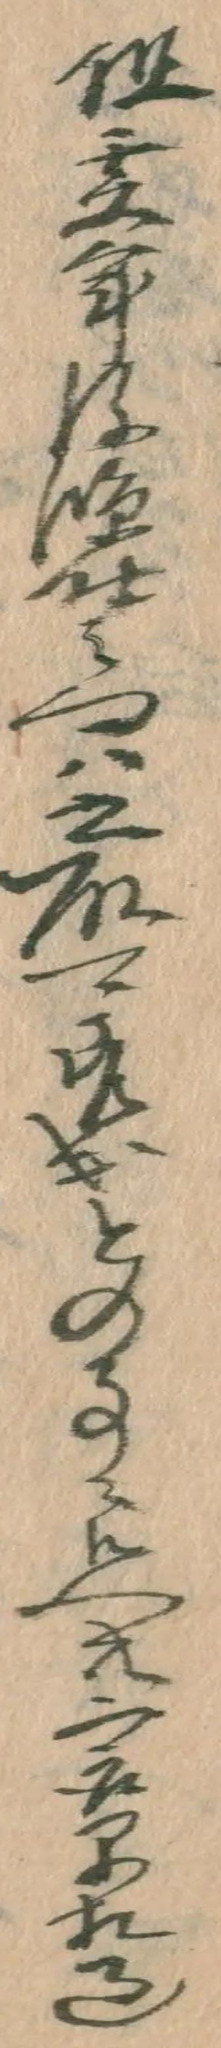但亥年後臨時之向ハ書取可差出との事ニ候へ共最早相過
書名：賀茂社記録. 第69冊
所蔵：国立国会図書館 National Diet Library, JAPAN
